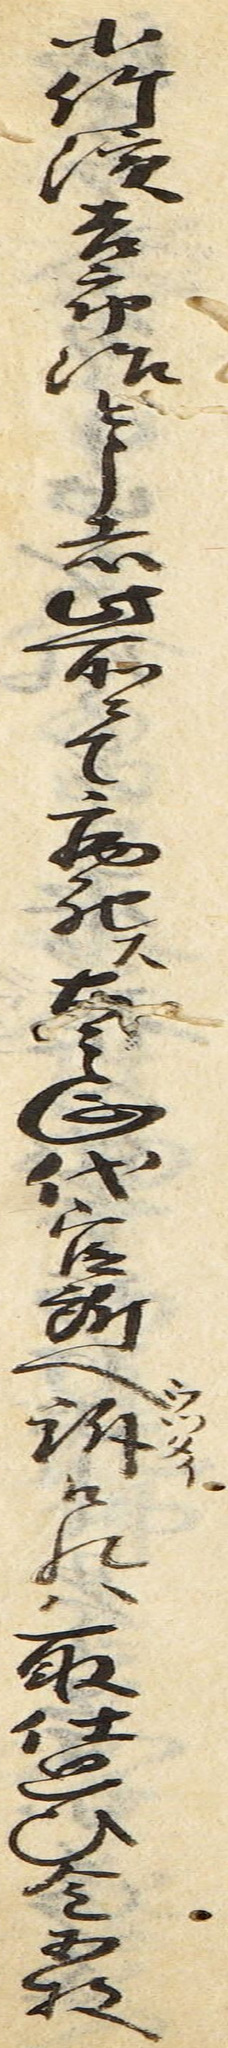に竹浜吉郎治と申者此所にて病死す右之趣代官所へ訴けれは取仕廻ひ金五枚

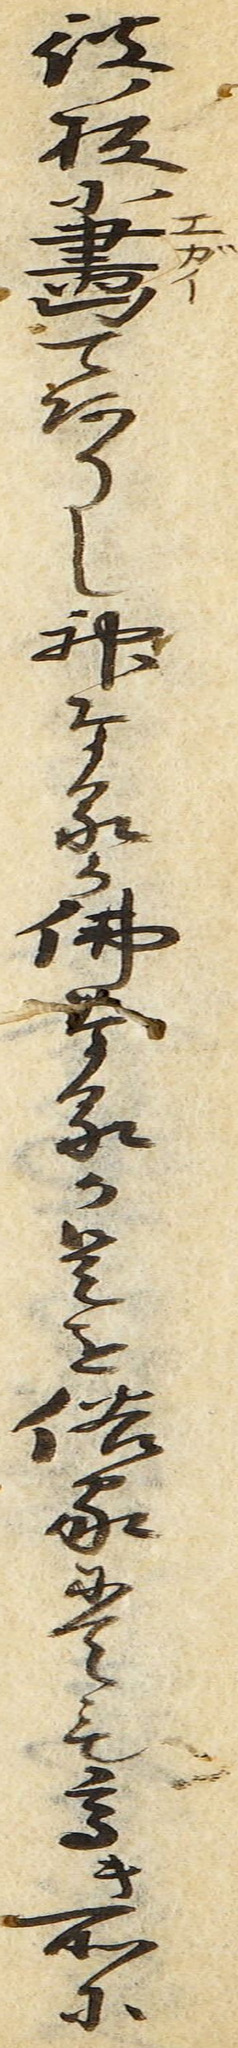彼ノ板に画てありし神なるか仏なるか是を俗家にても高き所に
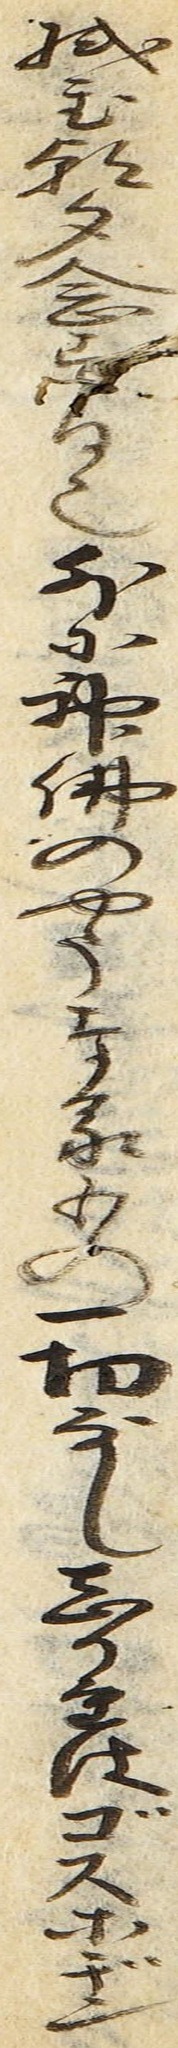掛置朝夕念する也外に神仏のやうなるもの一切なししかれはゴスホヂン
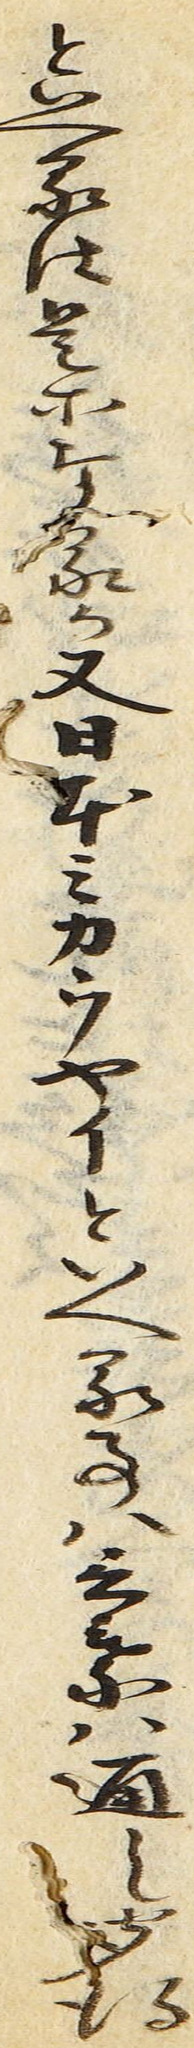といへるは是等なるか又日本ミカウヤイといへる事は言葉は通し聞得
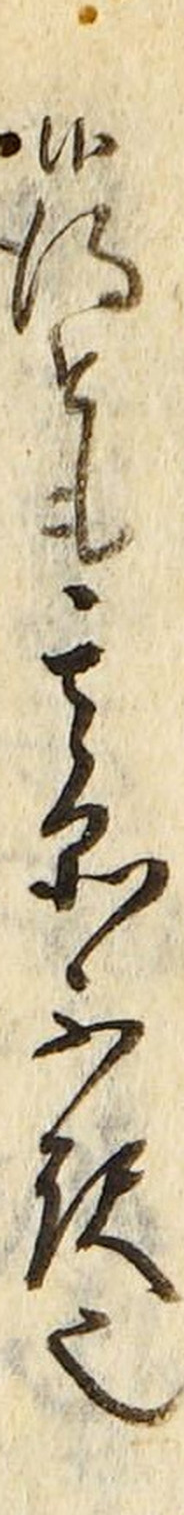候得とも其品不訳也
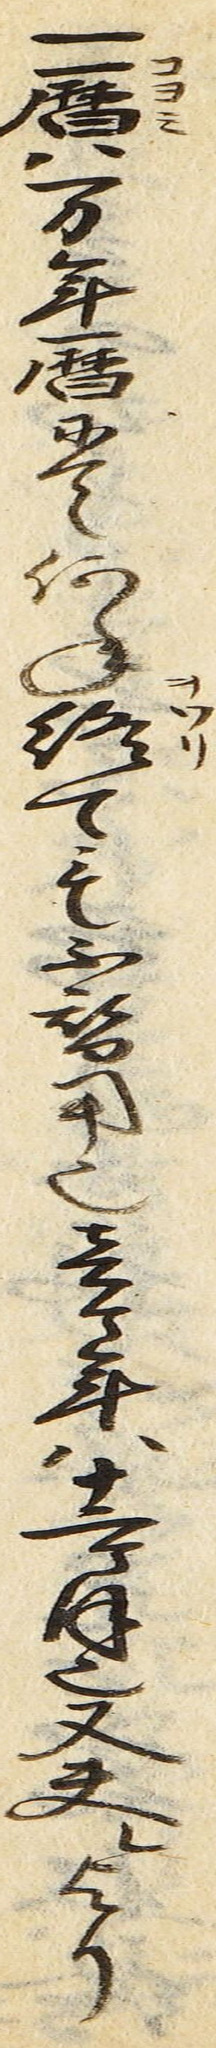一暦は万年暦にて何年終ても不替用也壱ヶ年は十二ヶ月也又夫れより
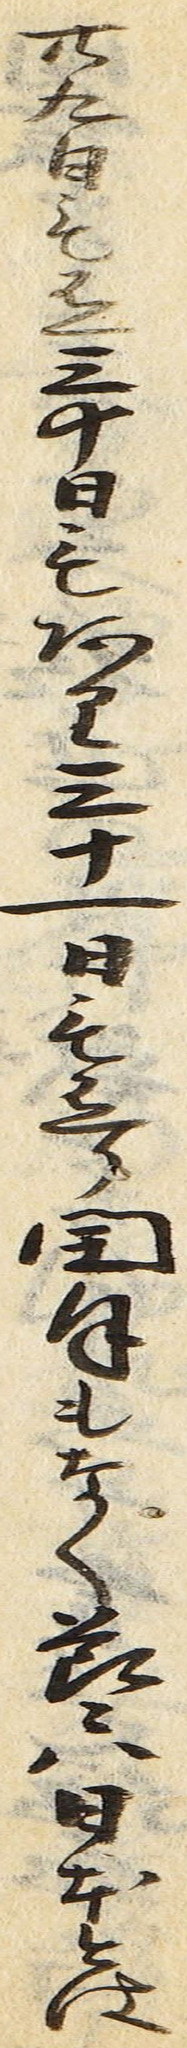廿九日も有三十日もあり三十一日も有り閏月もなく節には日本とは
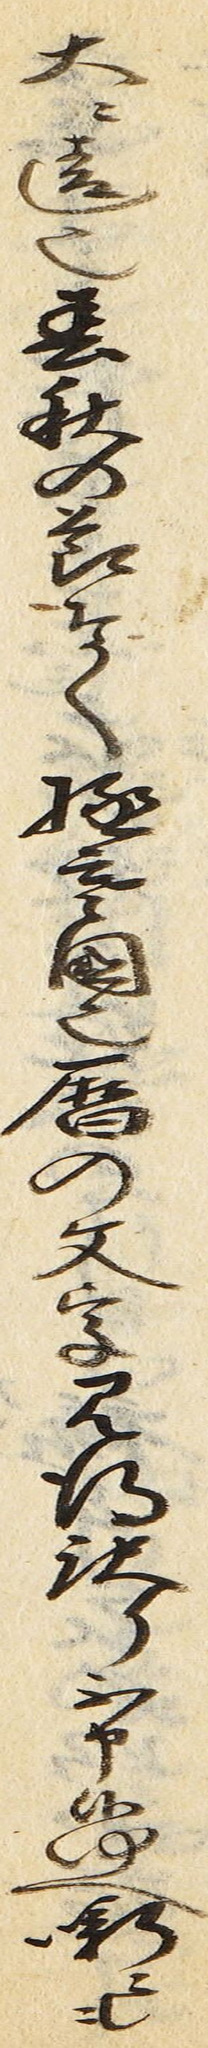大に違也春秋の節なく極寒国也暦の文字見得訳り不申候ゆへ噺にも
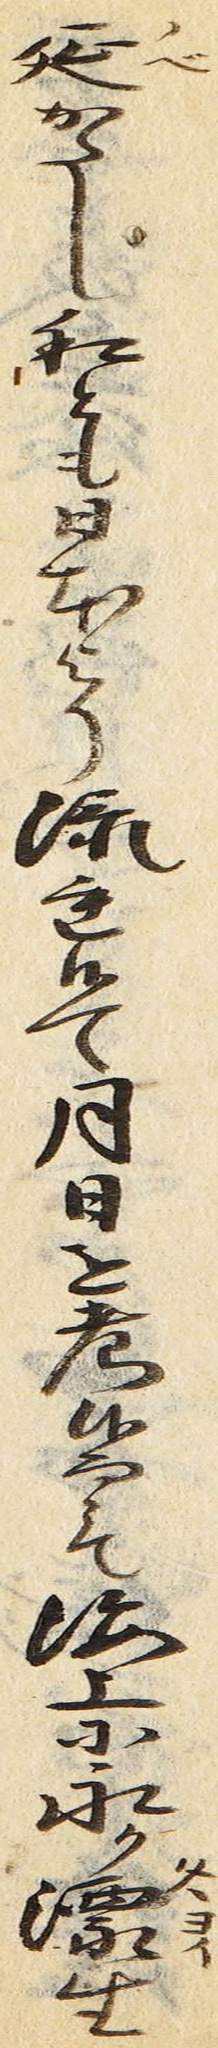延かたし私とも日本より流れ候て月日を考候而も海上に永く漂生
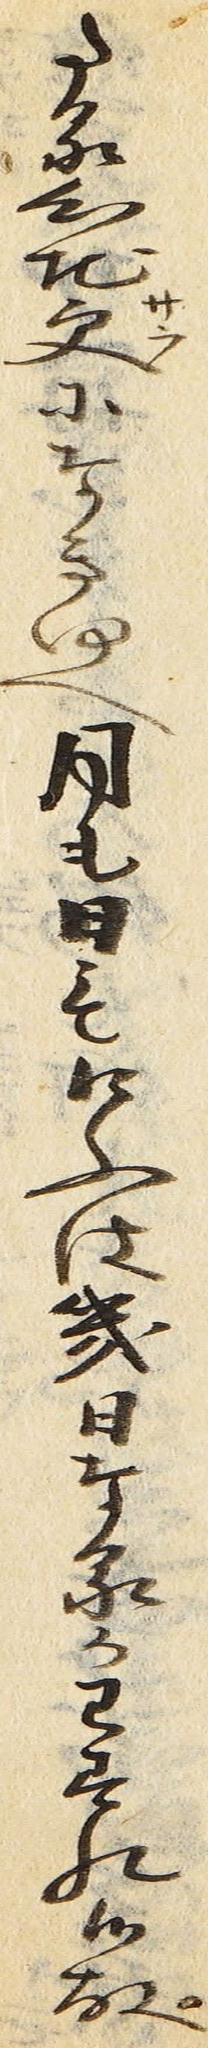たる心地更になきゆへ月も日もけふは幾日なるかわすれ候故
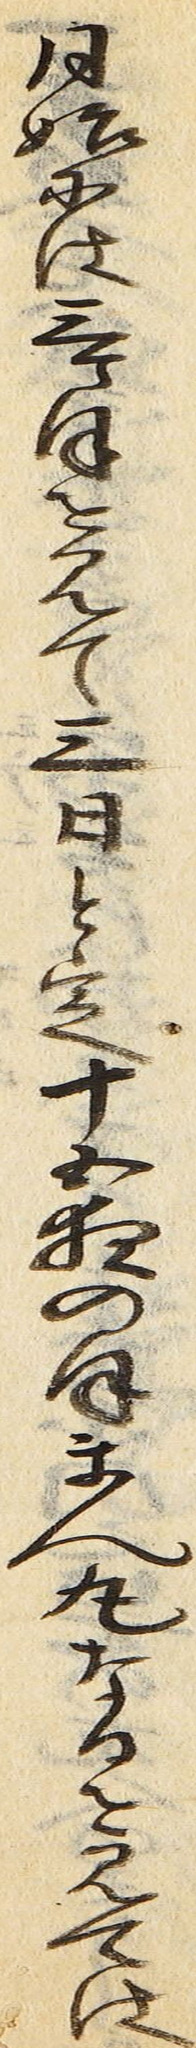月始には三ヶ月を見て三日と定め十五夜の月まん丸なるを見ては
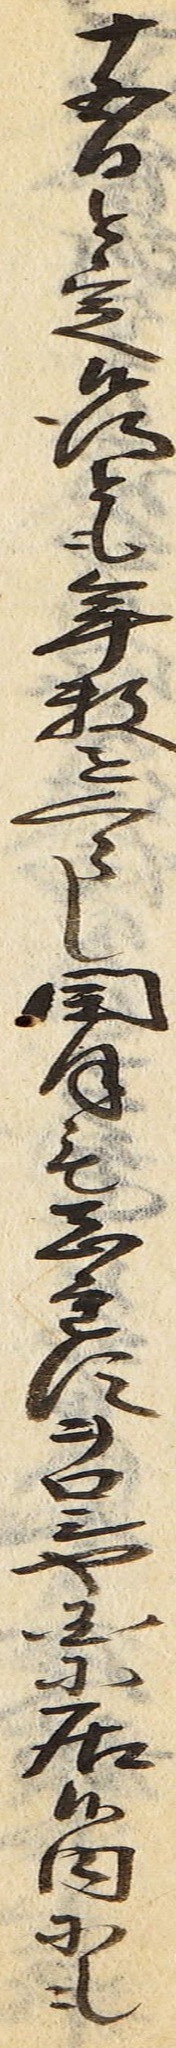十五日と定候得とも年数をくらし閏月もしれすヲロシヤ国に居候内にも
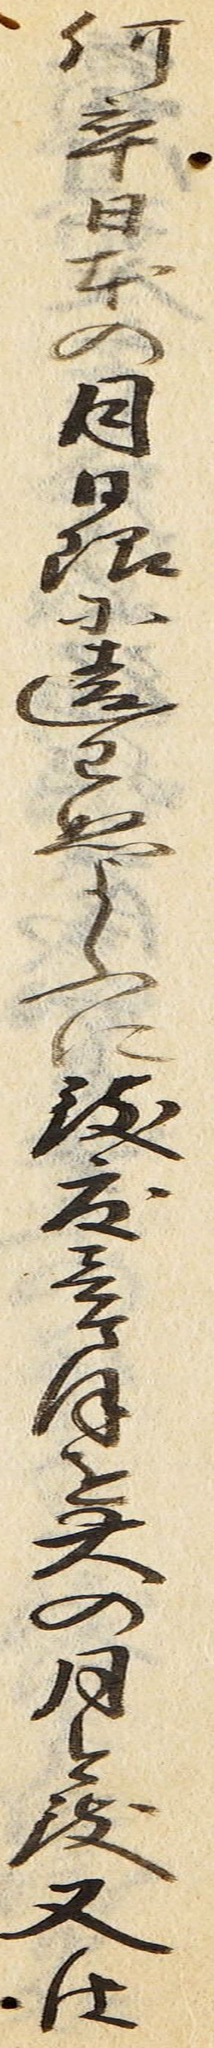何卒日本の月日限に違わぬよふに致度壱ヶ月を大の月致又は
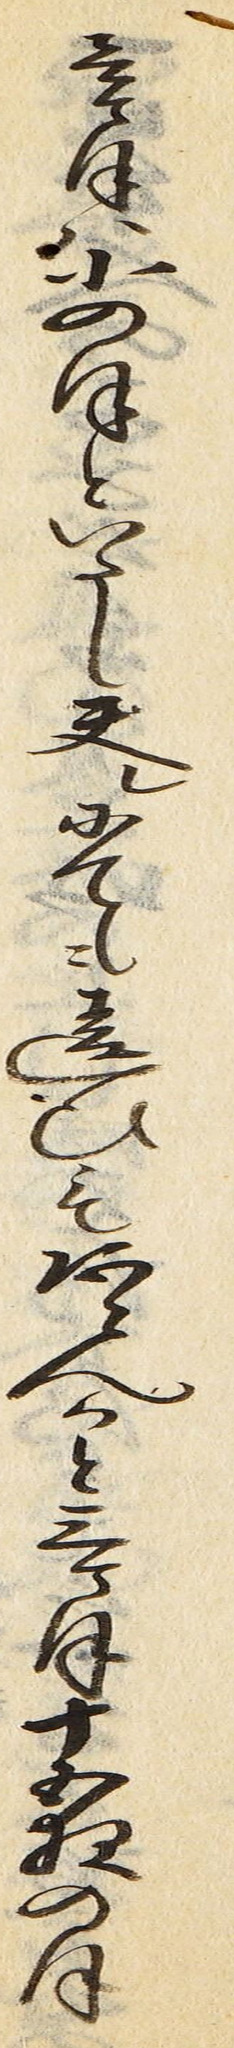壱ヶ月は小の月といたし夫れにても違ひもあらんかと三ヶ月十五夜の月
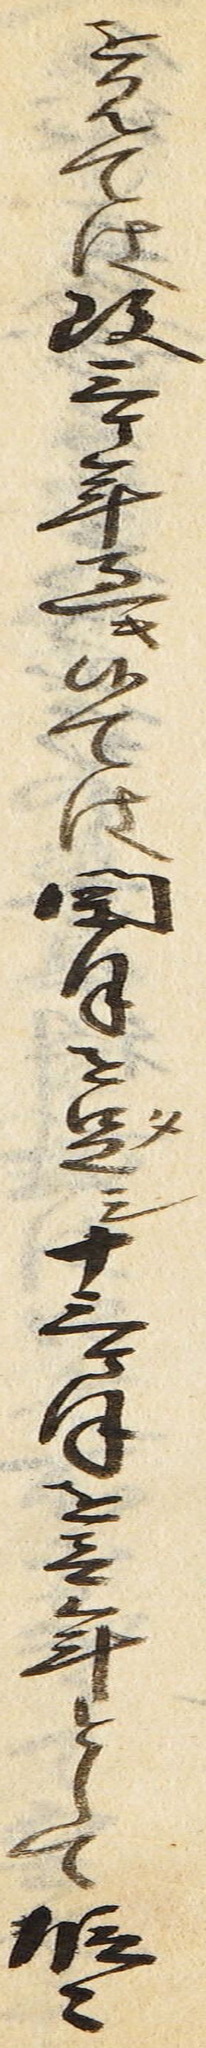を見ては改三ヶ年過き候ては閏月を足し十三ヶ月を壱年として段々
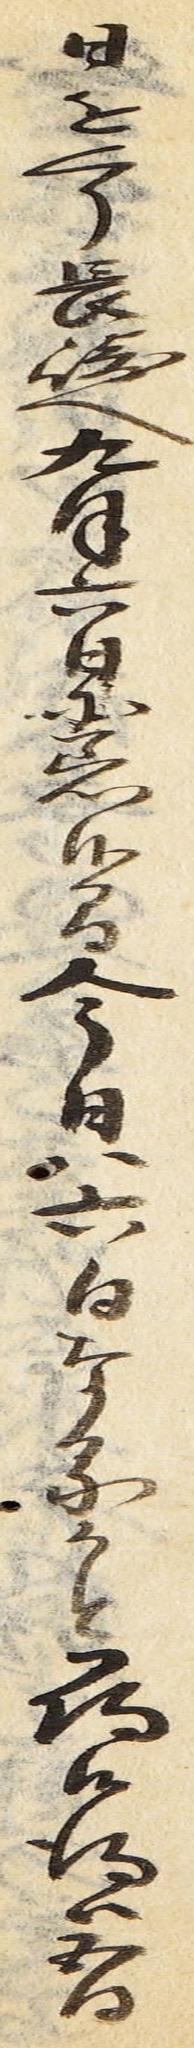日をくり長崎へ九月六日に着候間今月は六日なるかと尋候得は五日
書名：外国漂流記
